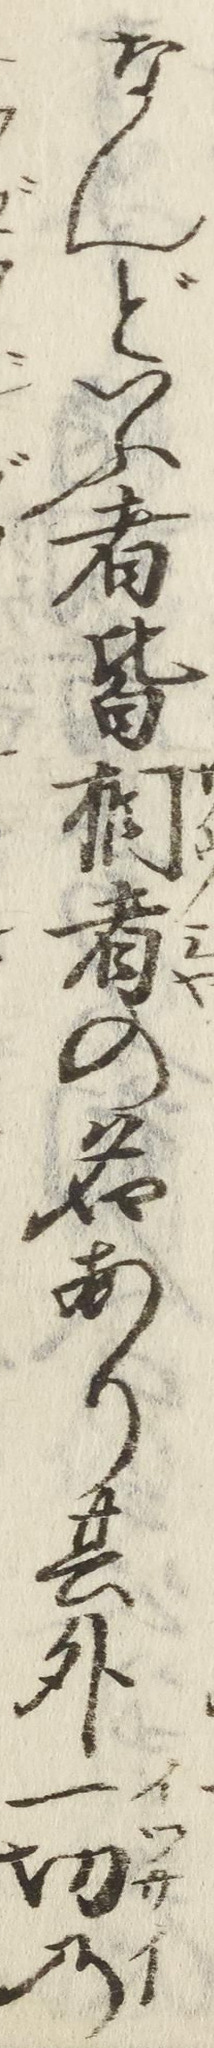なんどいふ者皆相者の名あり其外一切の
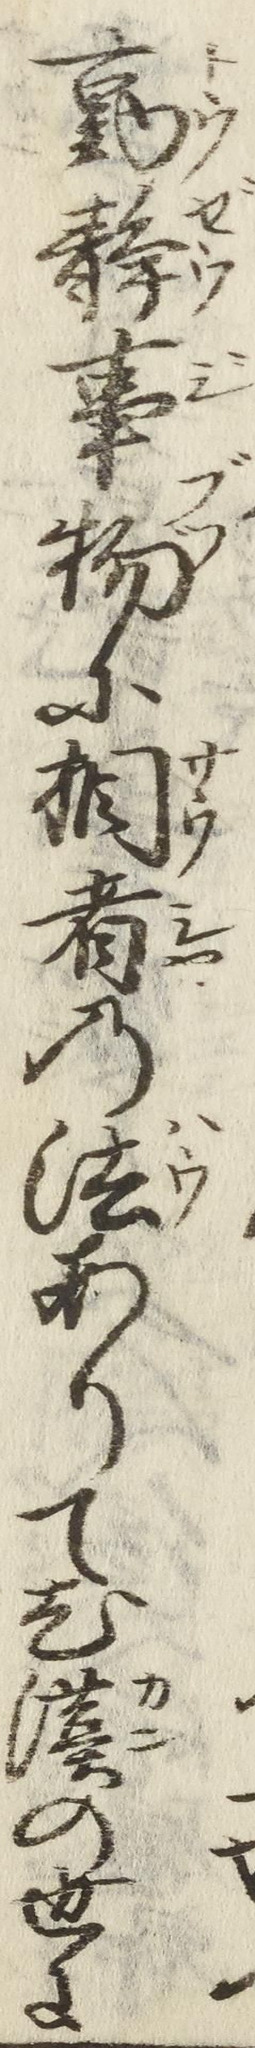動静事物に相者の法ありて尤漢の世に

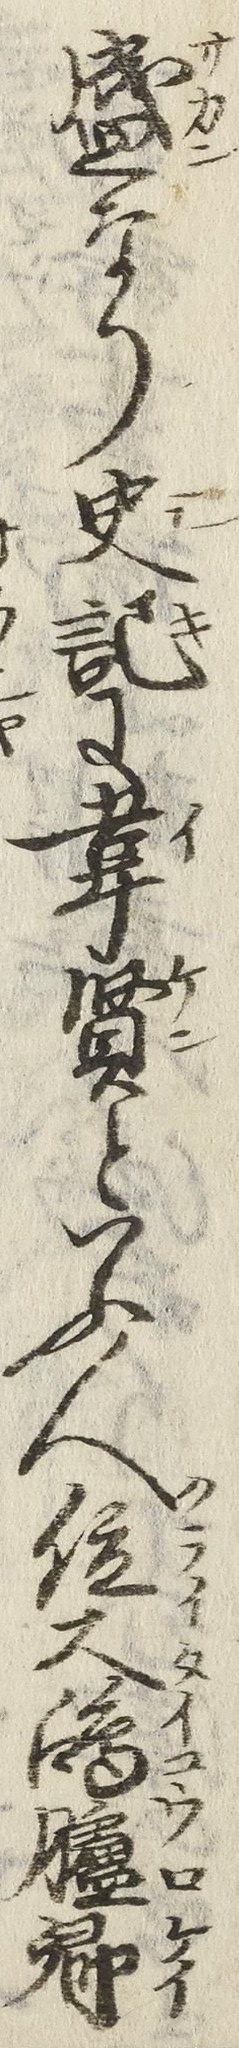盛なり史記に韋賢といふ人位大鴻臚卿
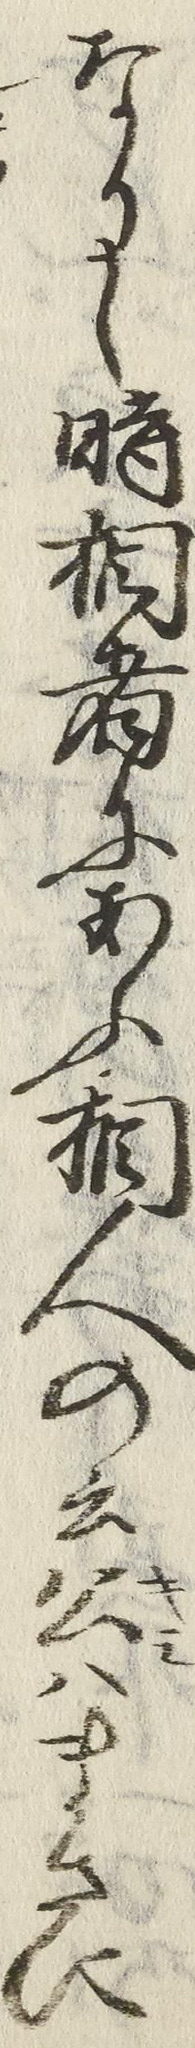なりし時相者にあふ相人の云公はまさに
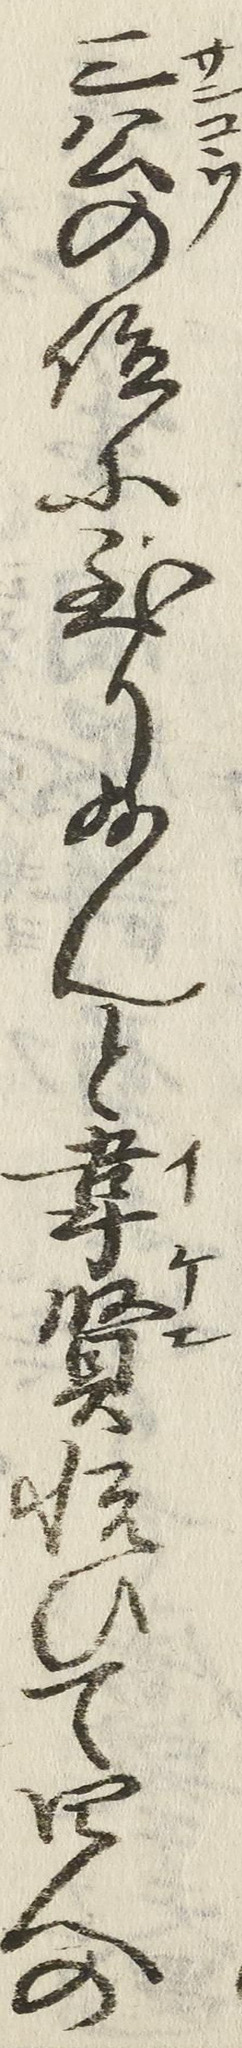三公の位に至り給んと韋賢悦ひて四人の
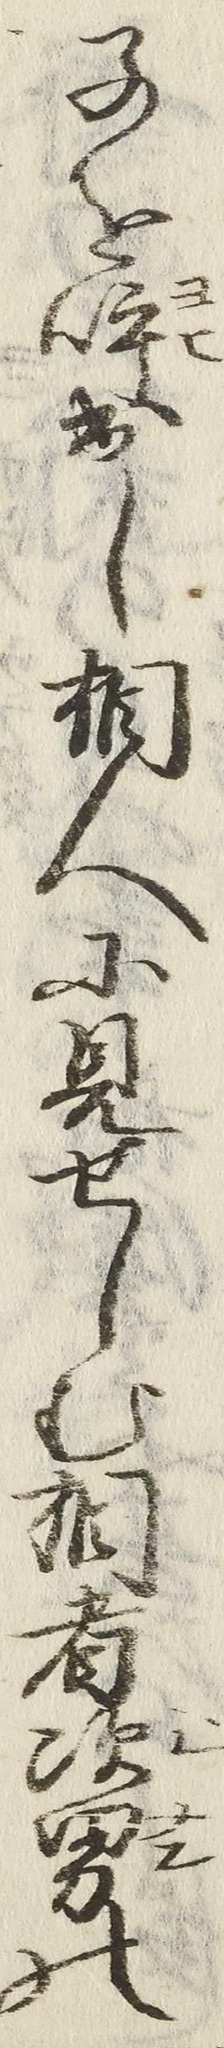子を呼出し相人に見せしむ相者次男の
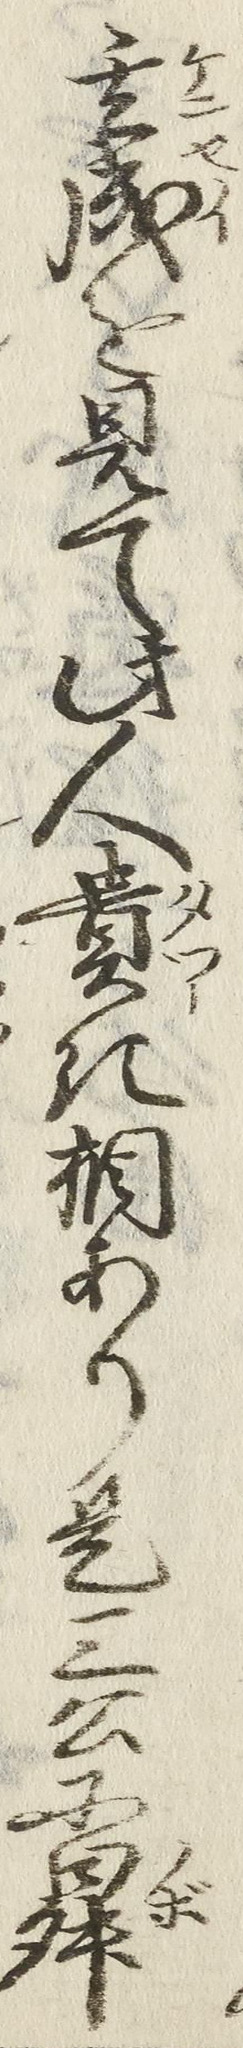玄成を見て此人貴き相あり是三公に昇
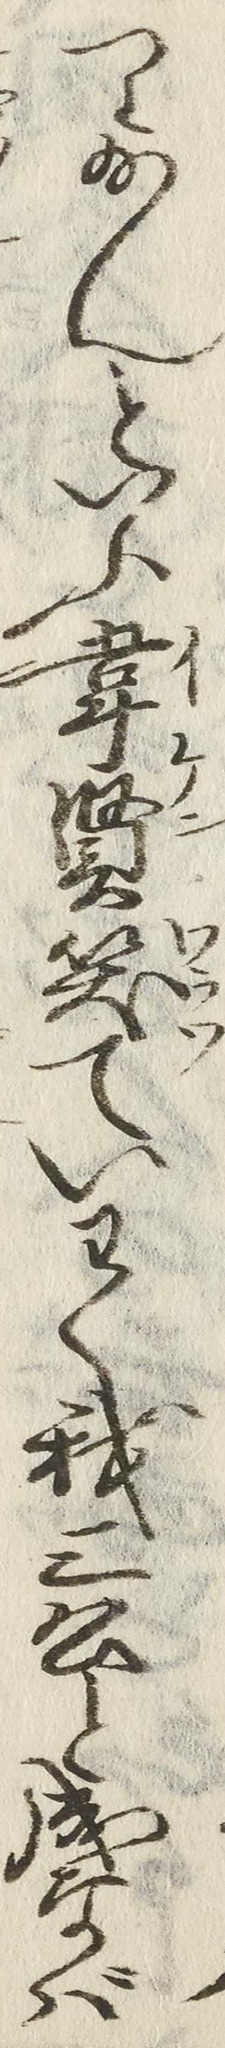り給んといふ韋賢笑ていわく我三公と成なば
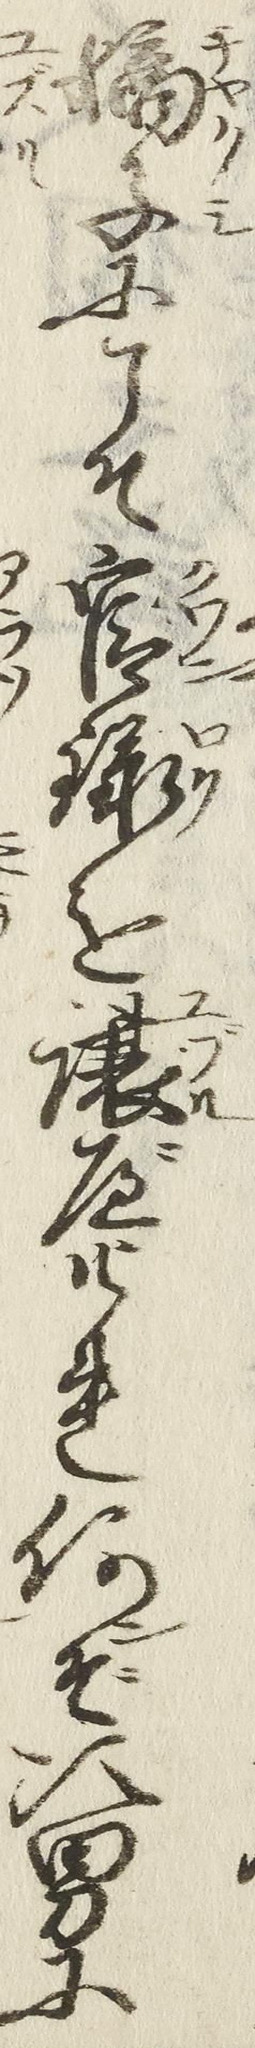嫡子にてそ官録を譲べけれ何んぞ次男に
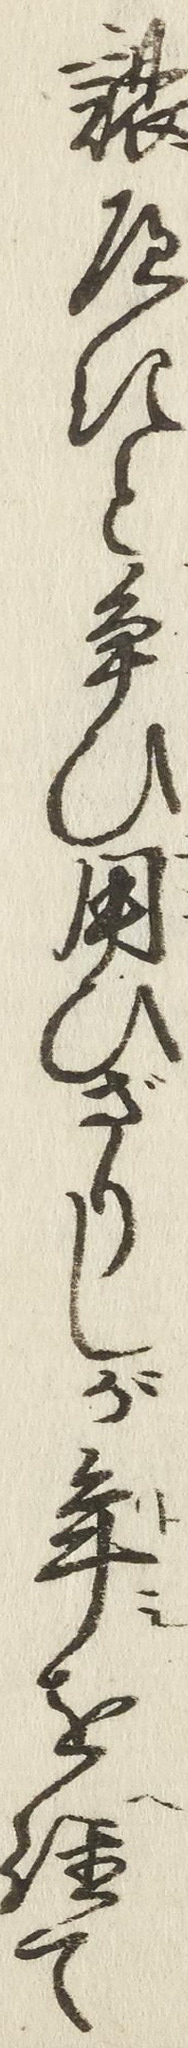譲へきと争ひ用ひざりしが年を経て
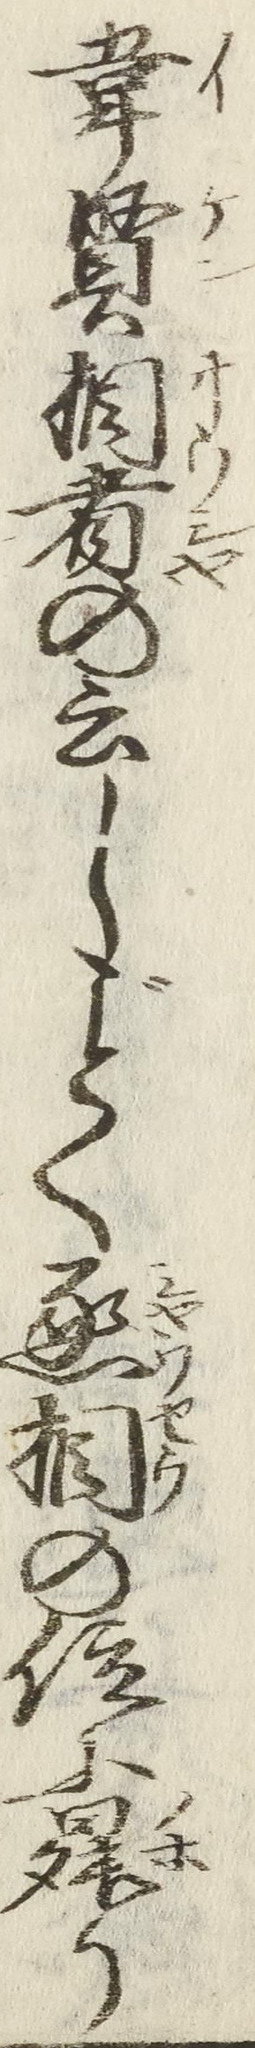韋賢相者の云しごとく丞相の位に昇り
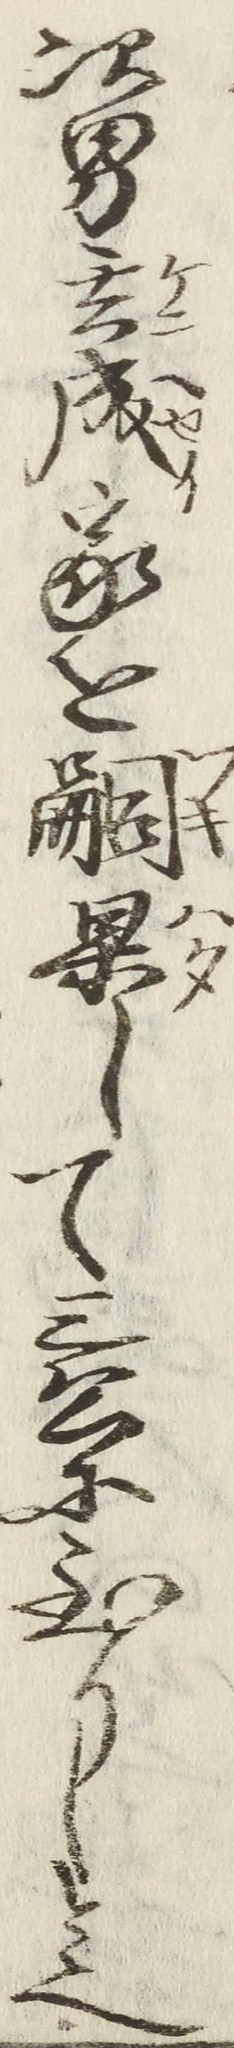次男玄成家を嗣果して三公に至りしと也
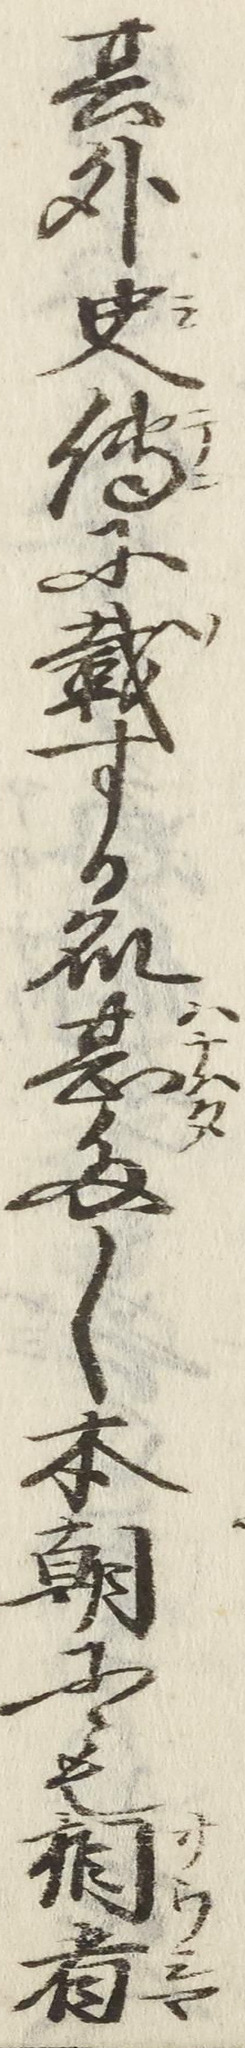其外史伝に載する処甚多し本朝にも相者
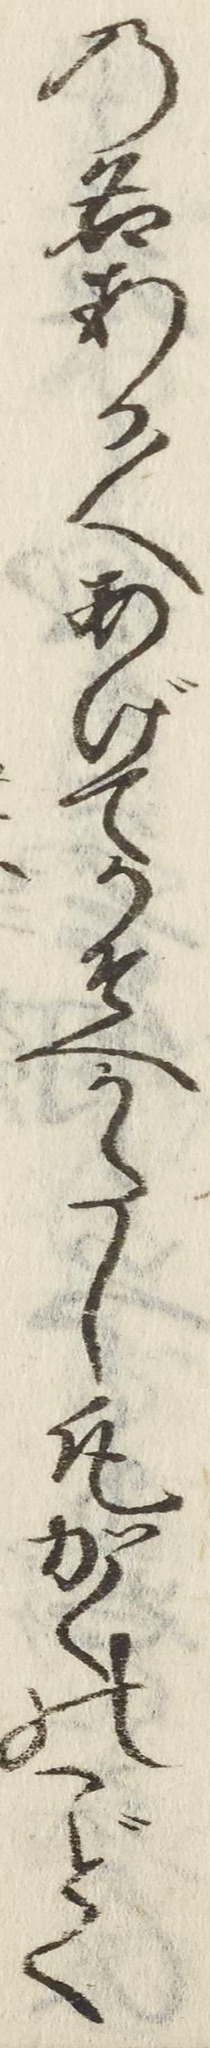の名あか〳〵あげてかそへかたし凡かくのごとく
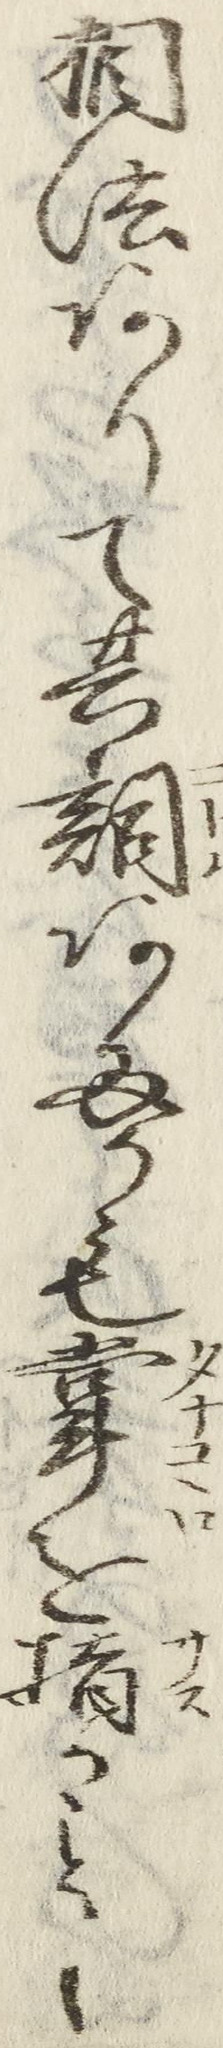相法ありて其詞あたかも掌を指ことし
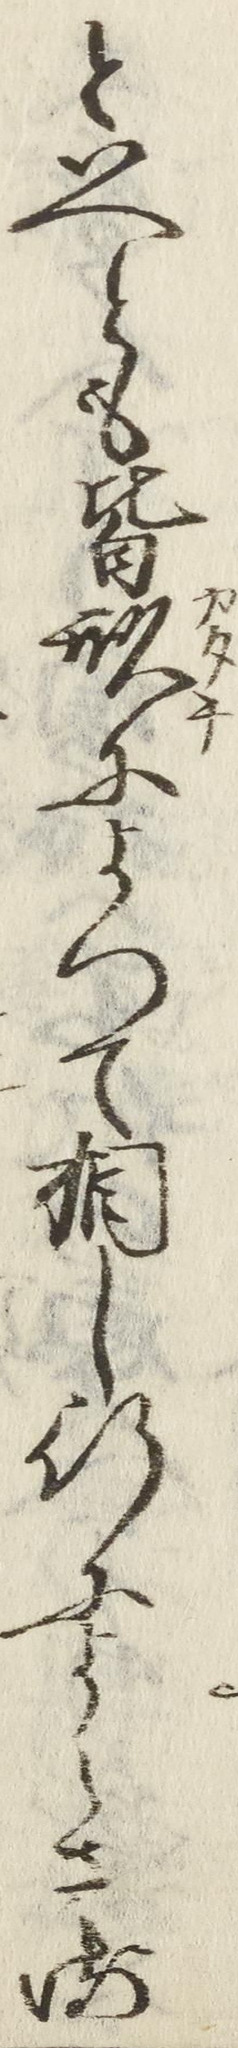といへとも皆形によつて相し行によらさる
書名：天地或問珍　地
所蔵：東京大学地震研究所図書室 Earthquake Research Institute Library, The University of Tokyo, JAPAN
